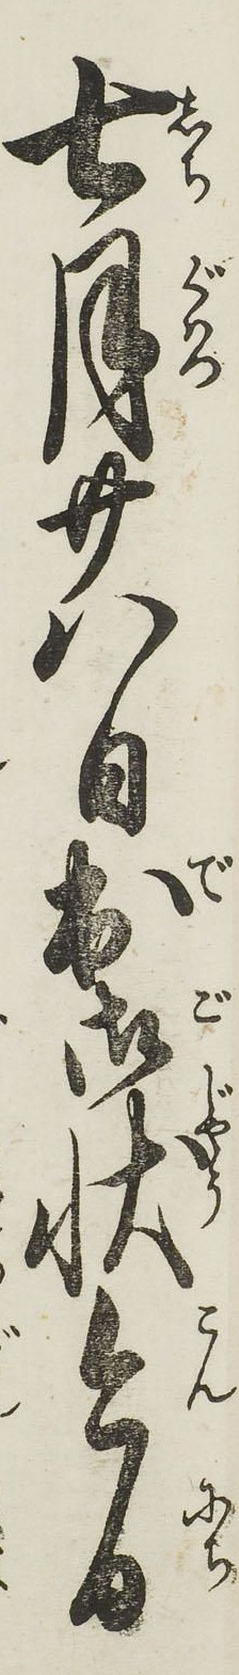七月廿八日出御状今日

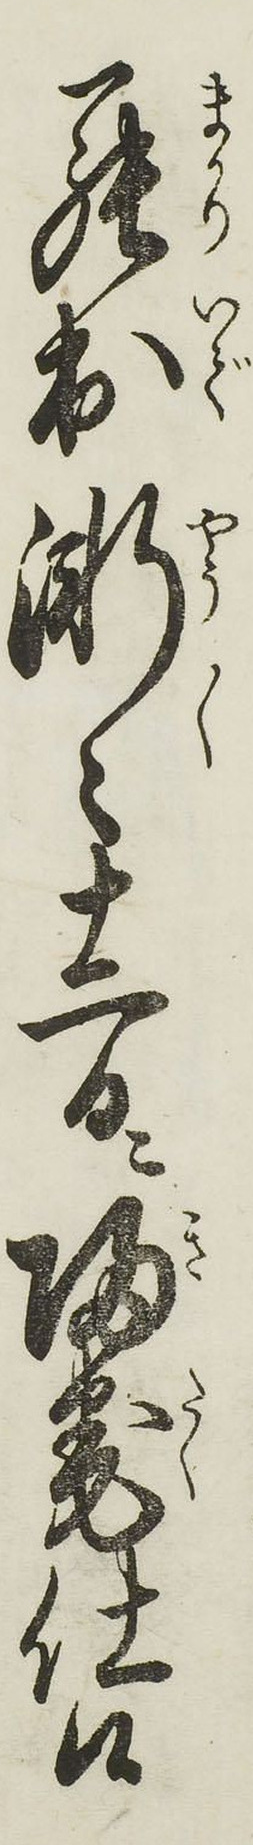罷出漸々十二日帰宅仕候
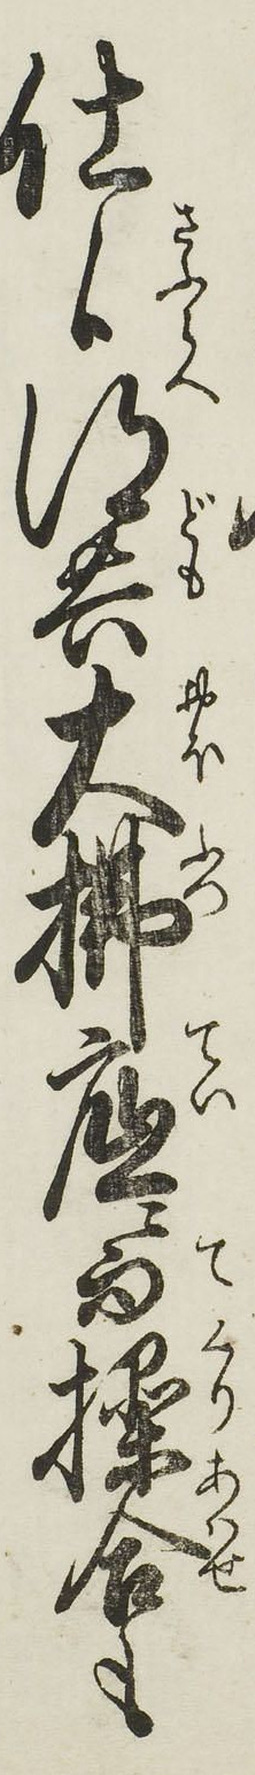仕候得共大払底而繰合も
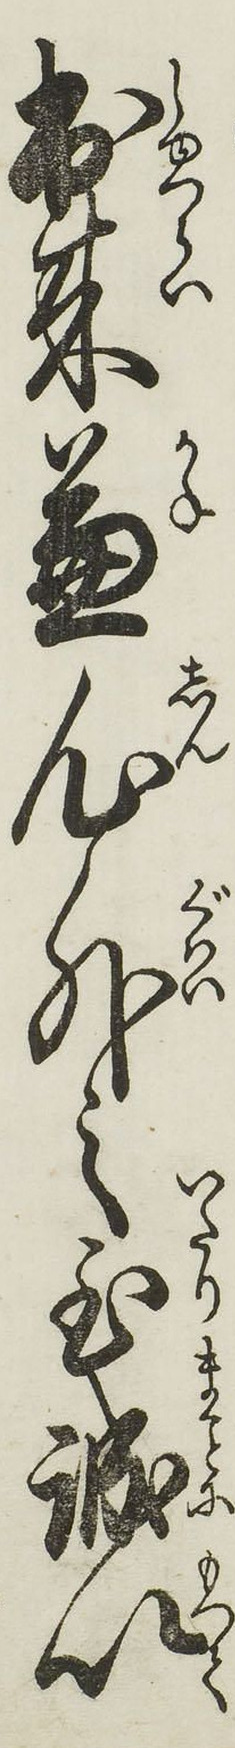出来兼心外之至誠以
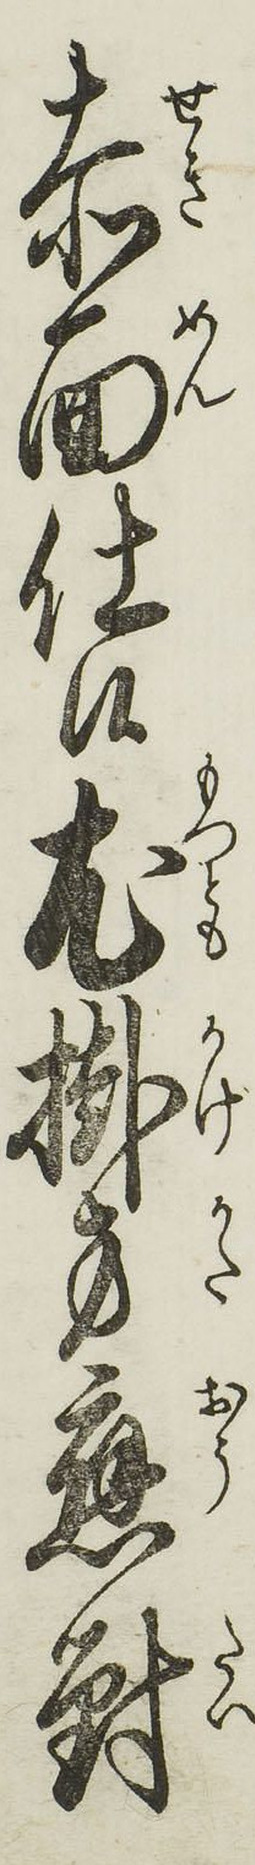赤面仕候尤掛方応対

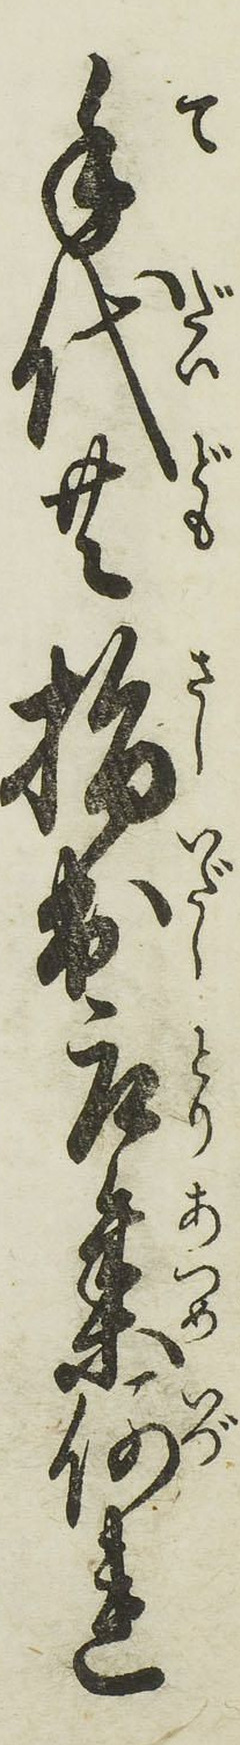手代共指出取集何れ
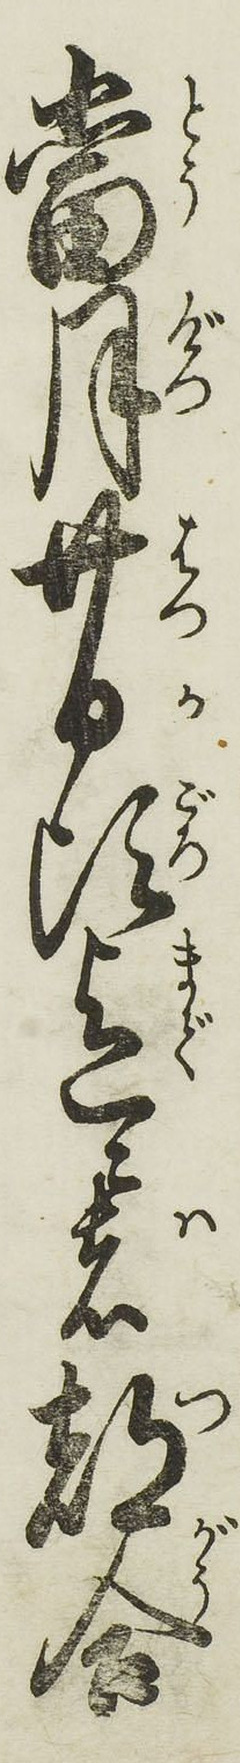当月廿日頃迄者都合
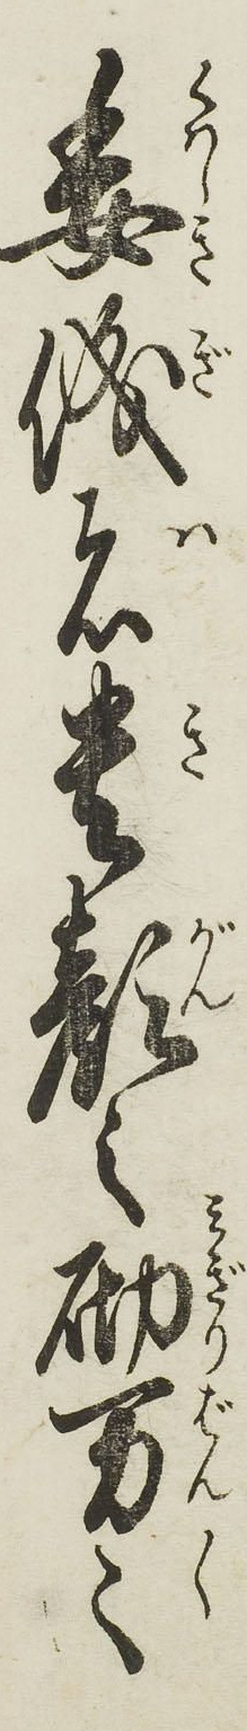委儀者貴顔之砌万々
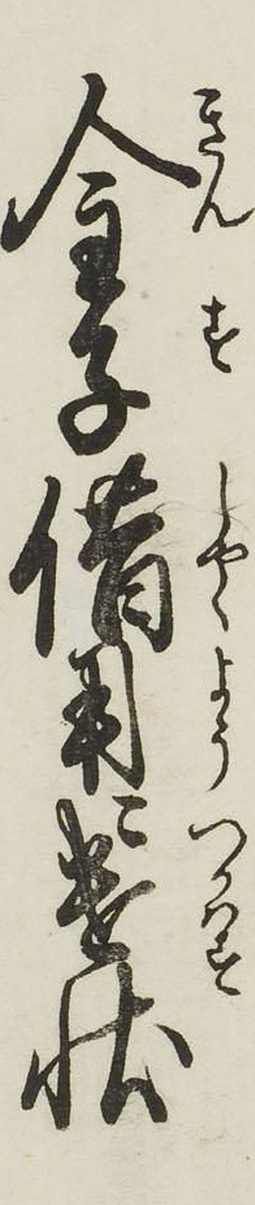金子借用遣状
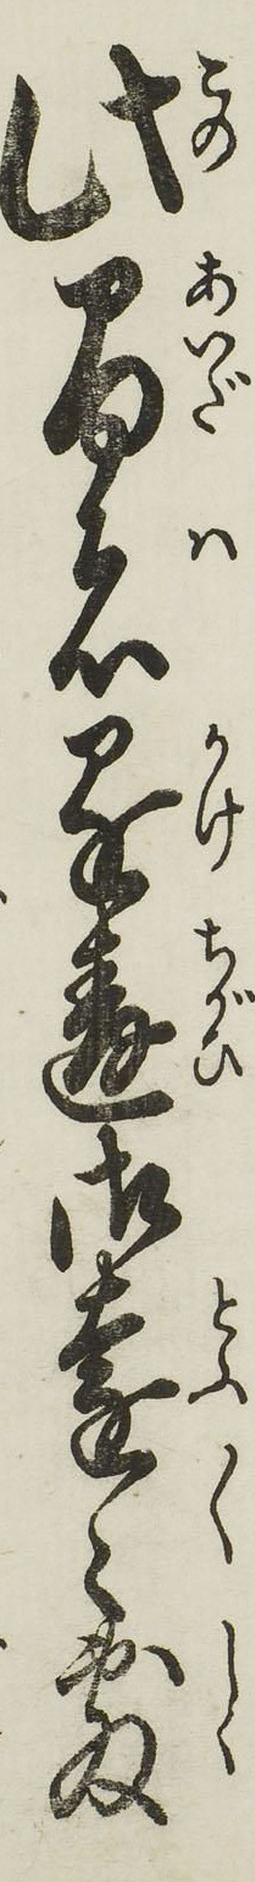此間者懸違御遠々敷

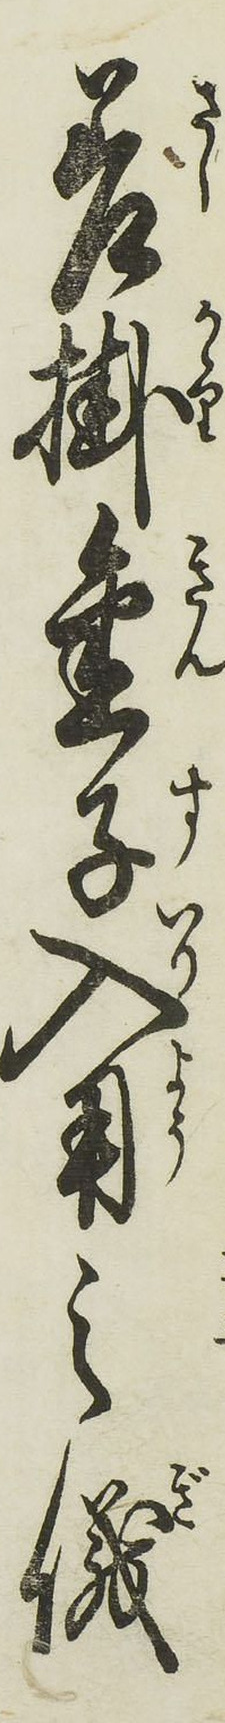差掛金子入用之儀
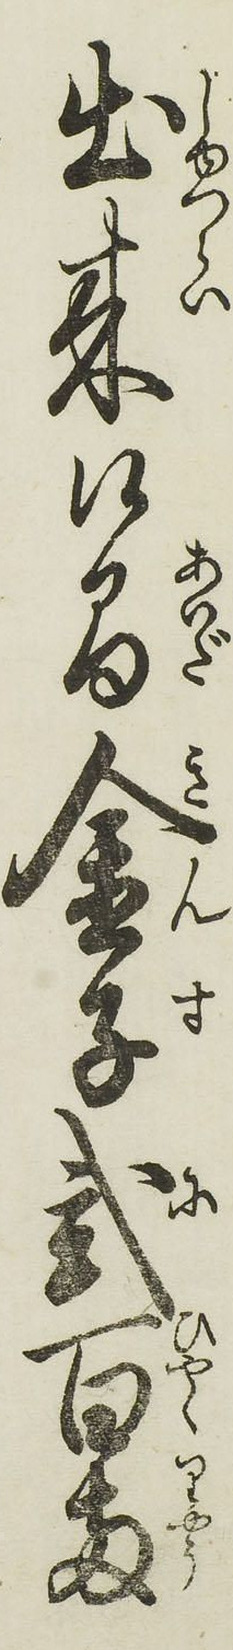出来候間金子弐百両
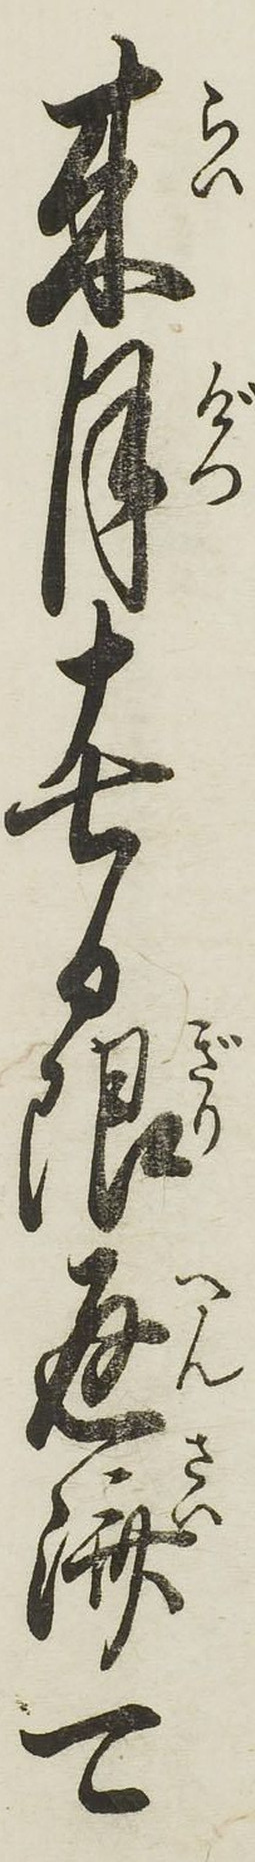来月十七日限返済可
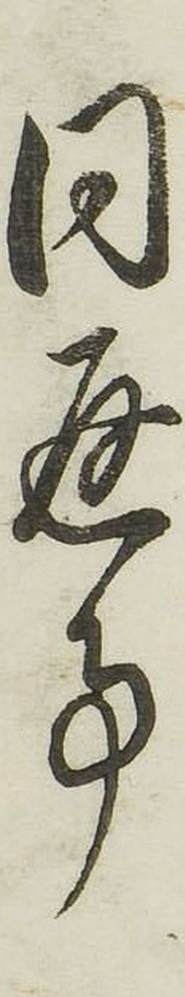同返事

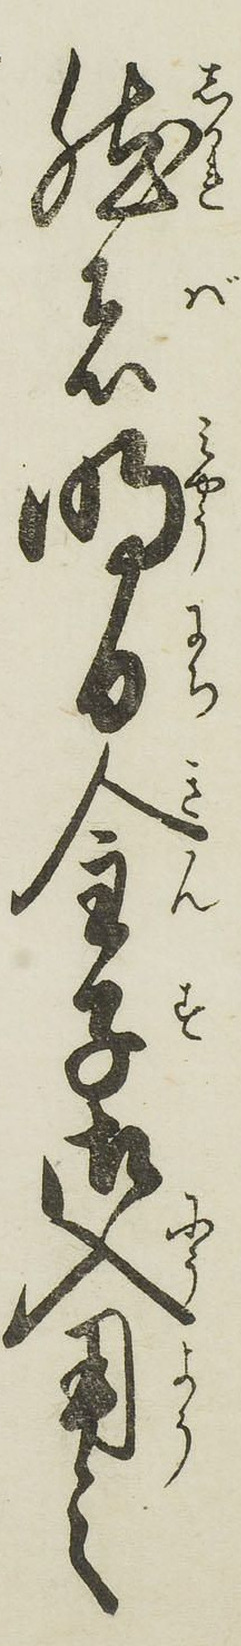然者明日金子御入用之
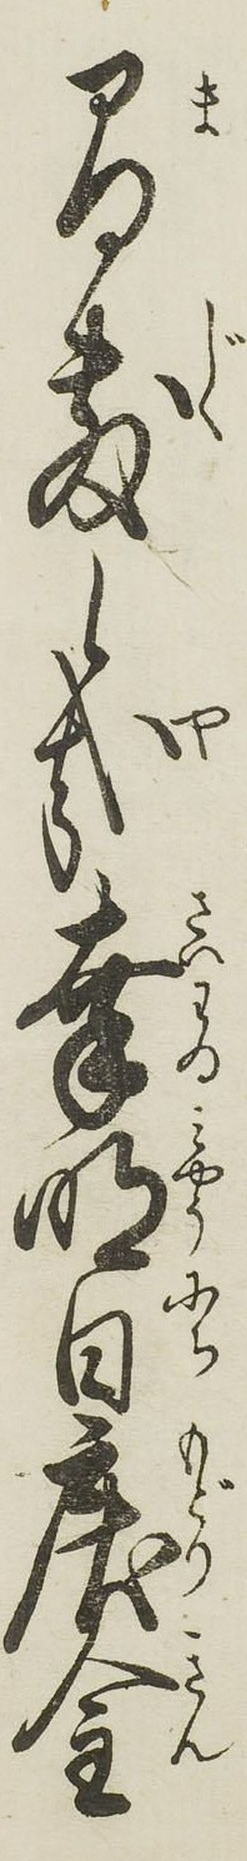間敷候哉幸明日戻金
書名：商人書翰便覧
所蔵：東京学芸大学教育コンテンツアーカイブ
